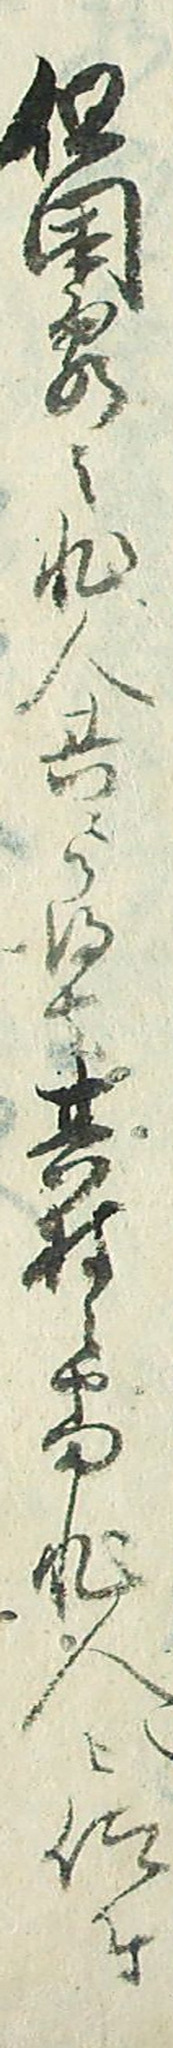但困窮之非人共に候得者其村之番非人へ被仰付
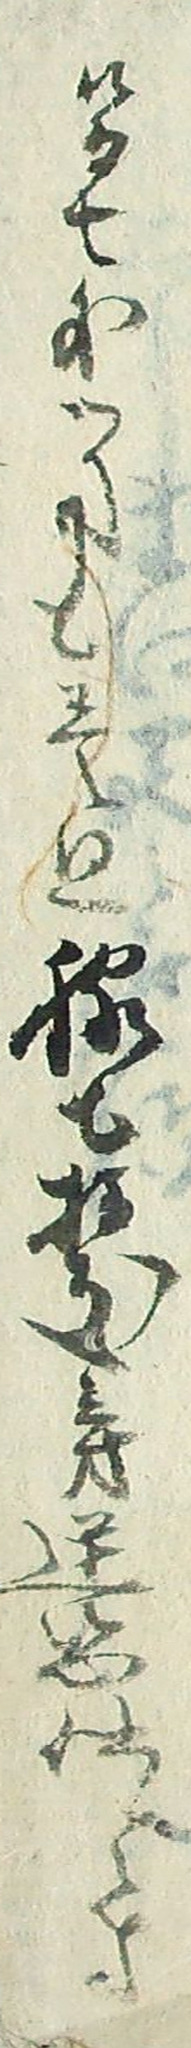候而は外御用も有之且稼も指支旁迷惑仕に付

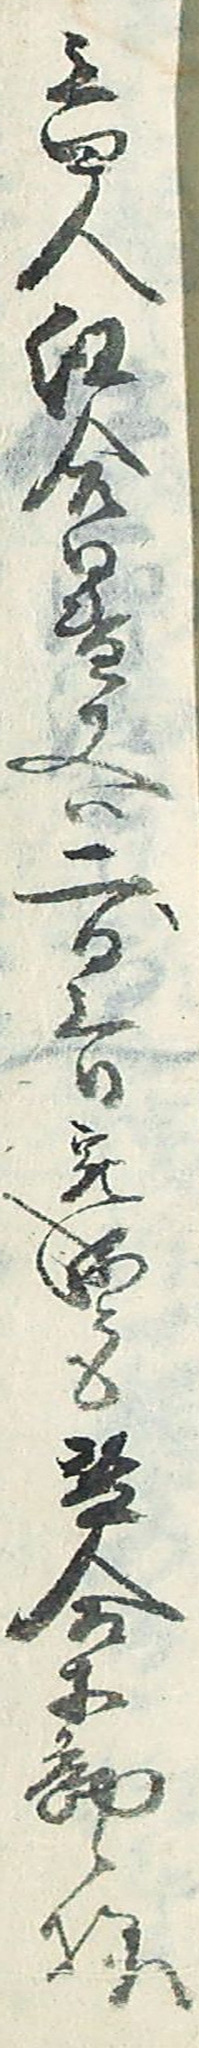三四人組合日替又は二日三日宛成とも替合相勤候様
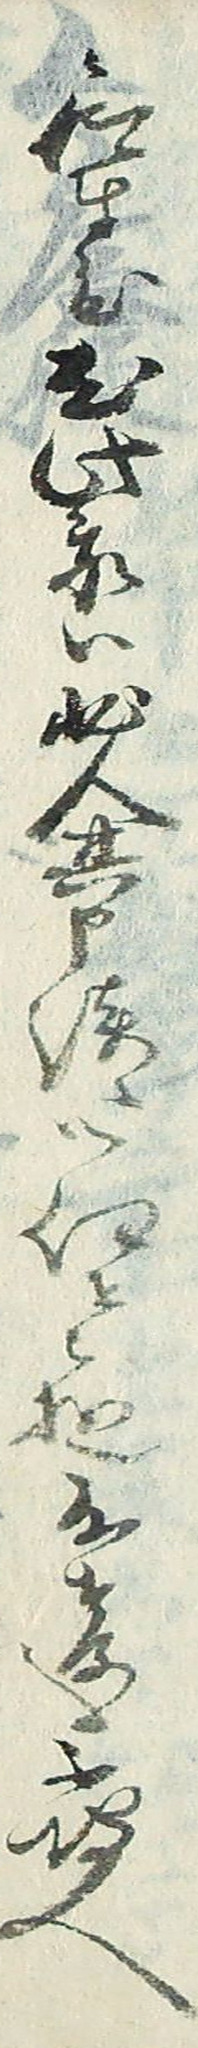被仰付度尤此義は非人共申談に御任せ被遊度奉存候不埒人
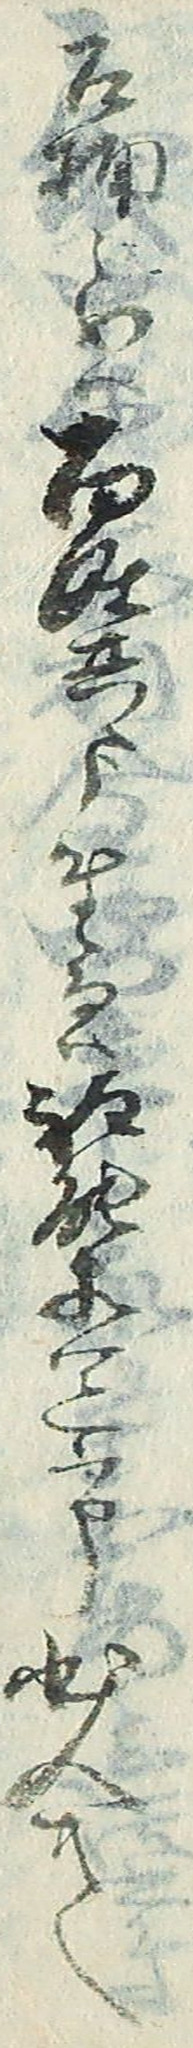召捕之義は百姓共申付候而は程能相運不申非人共へ
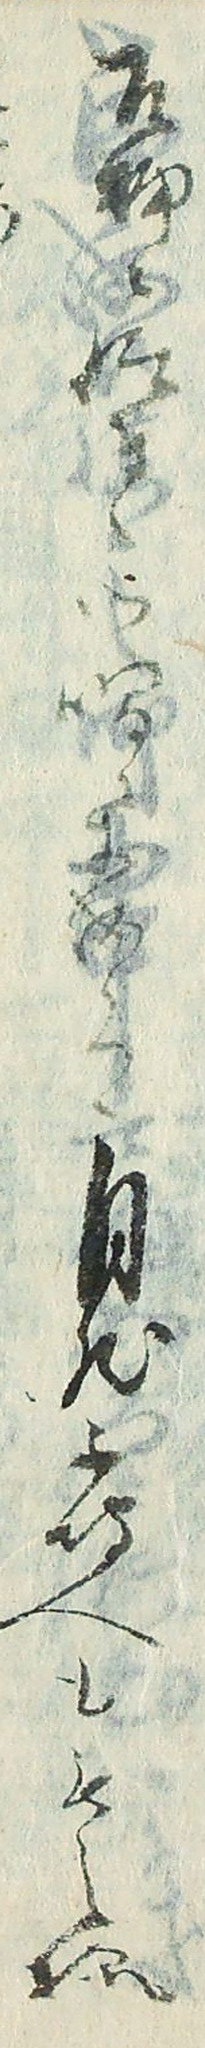召捕被仰付候御唱に相成候はゝ自然不埒人も無之様
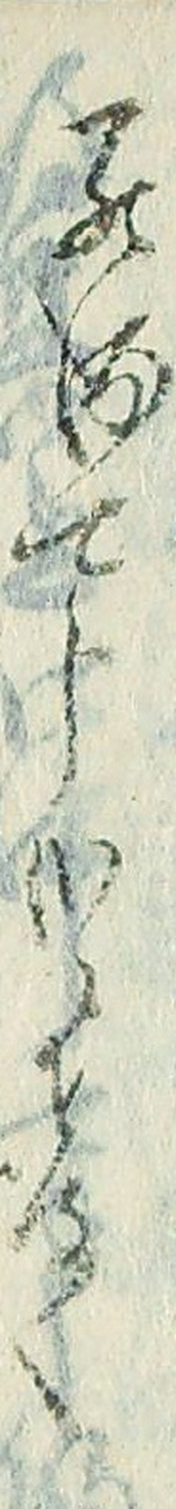罷成可申哉と奉存候
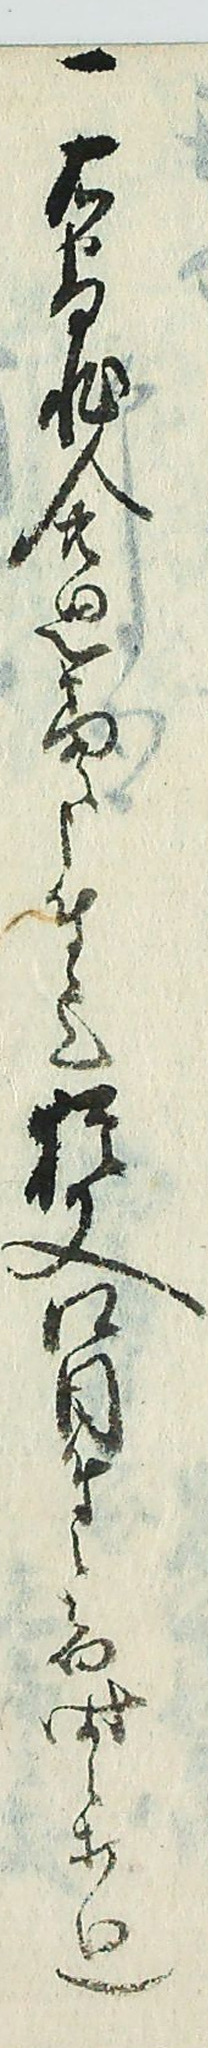一右番非人共廻番に申付候上猶又郷目付之者時々打廻
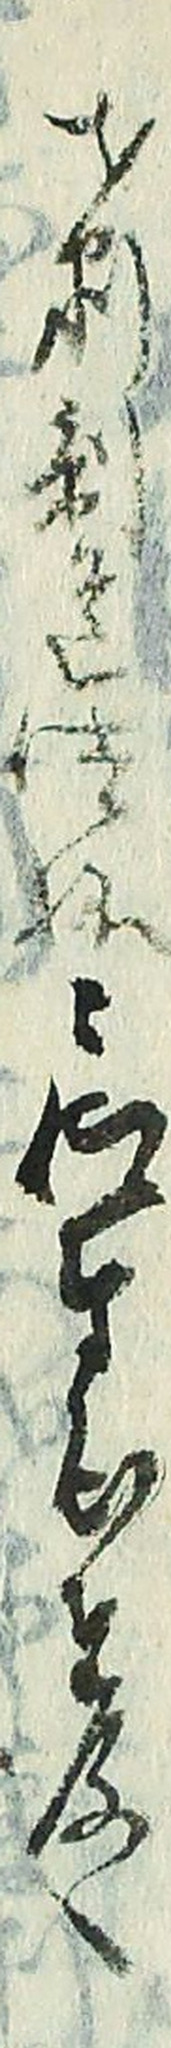才料制道仕候様被仰付度奉存候
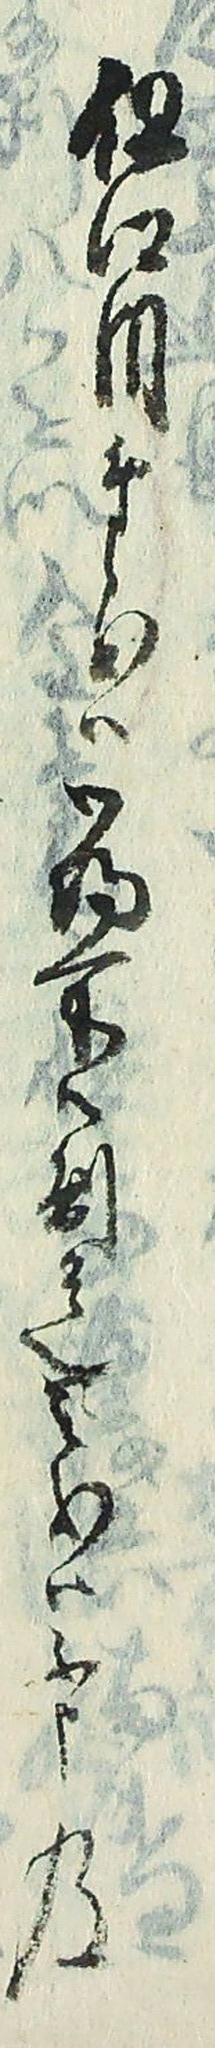但郷目付之義は御場所御制道之義は不申及
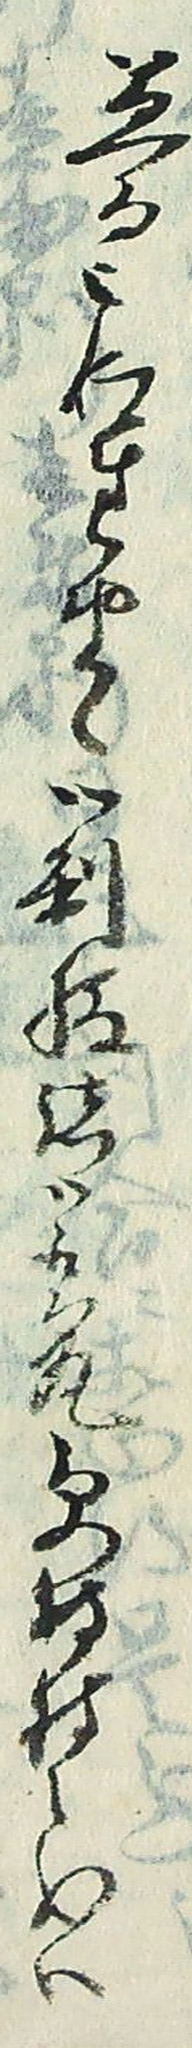兼而被仰付御坐候御制服諸御取究受持村之義は
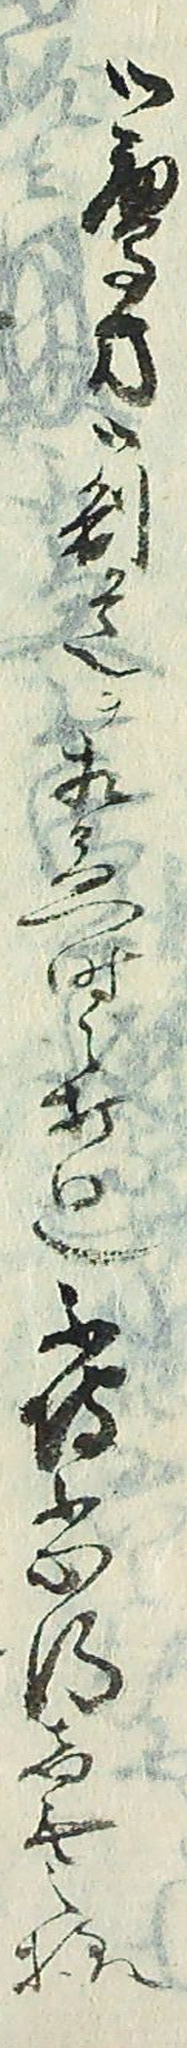御鷹方御制道を相兼時々打廻不埒不心得者無之様
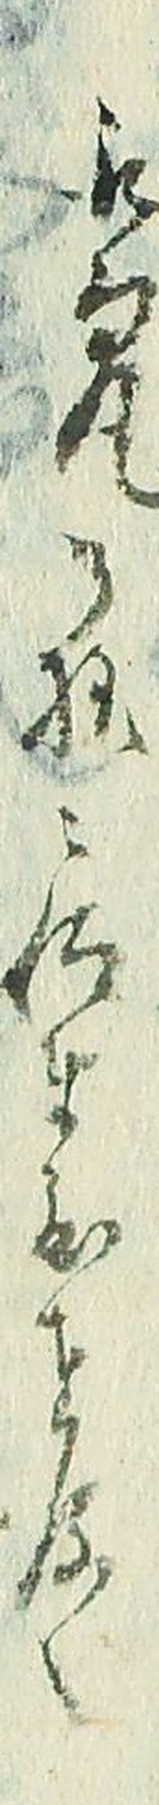取究候様被仰付度奉存候
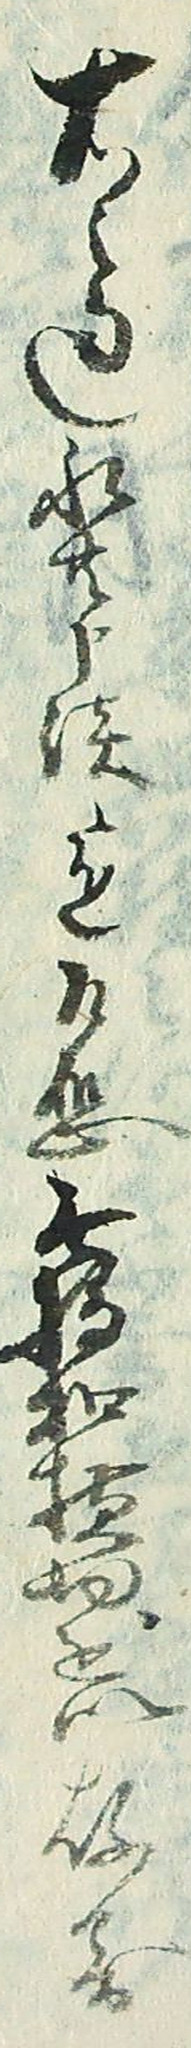右之通私共申談候を乍恐無指扣横切を以存寄
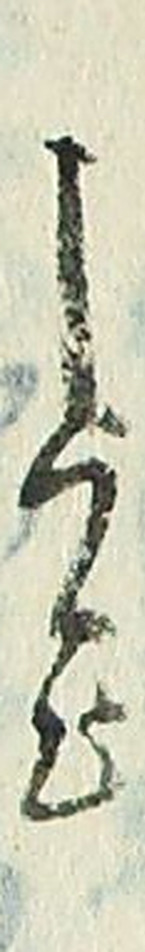申上候以上
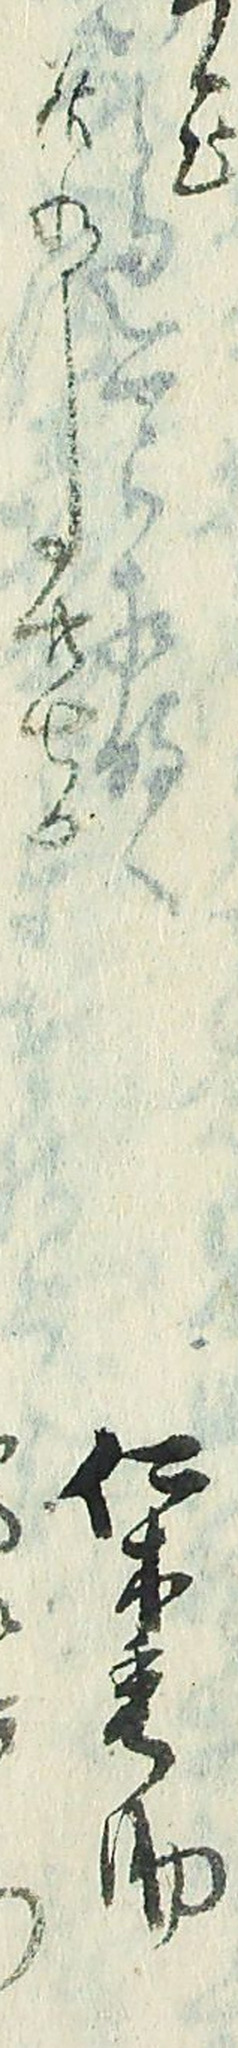辰九月廿七日仁木秀助
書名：諸御用御□受書控
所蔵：鳴門教育大学 Naruto University of Education
